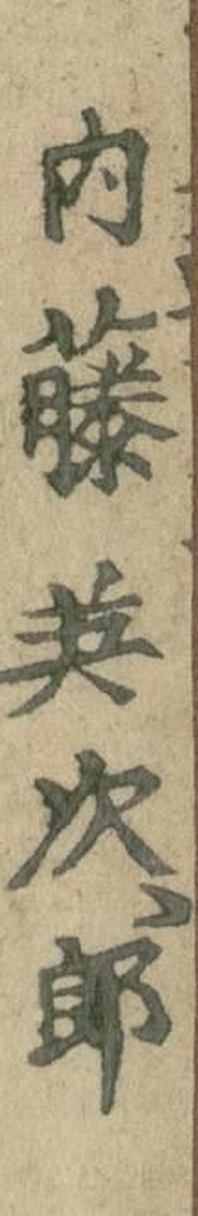内藤英次郎
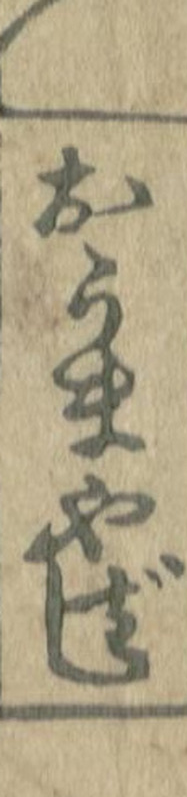おうまやばし
